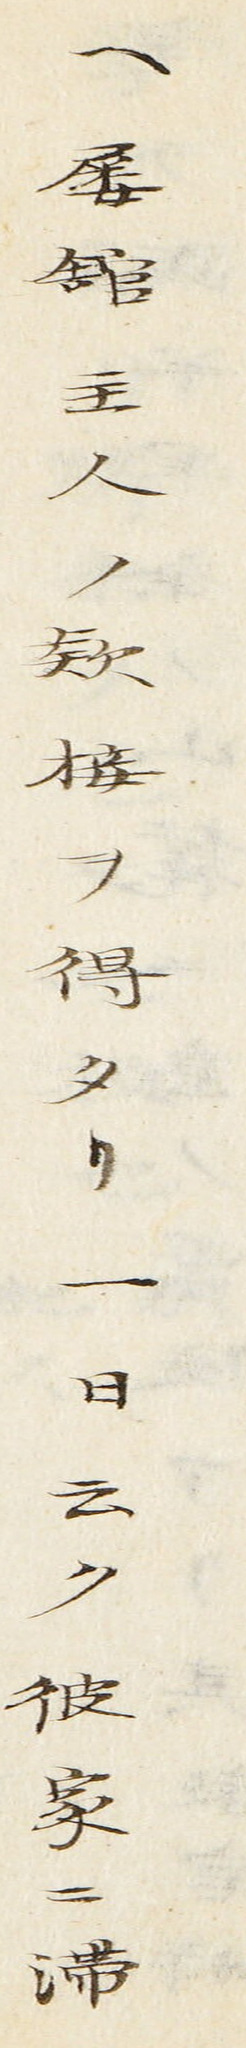ヘ屡館主ノ欵接ヲ得タリ一日云ク彼家ニ滞
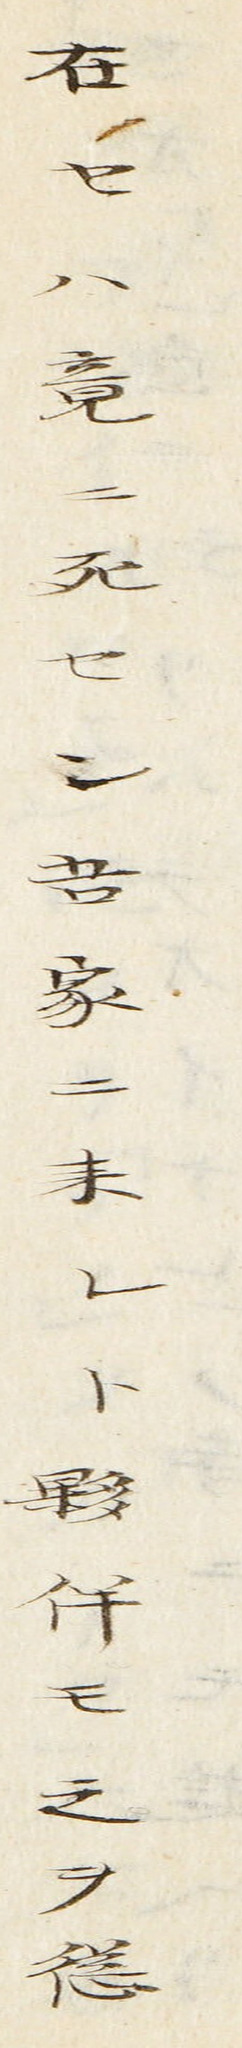在セハ竟ニ死セン吾家ニ来レト夥伴モ之ヲ慫
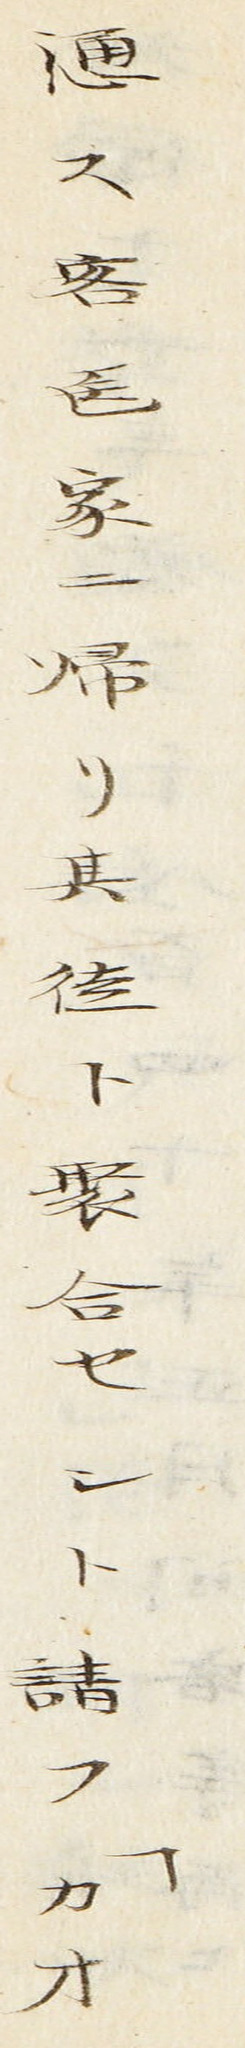慂ス客医家ニ帰リ其徒ト聚合セント請フ「カオ
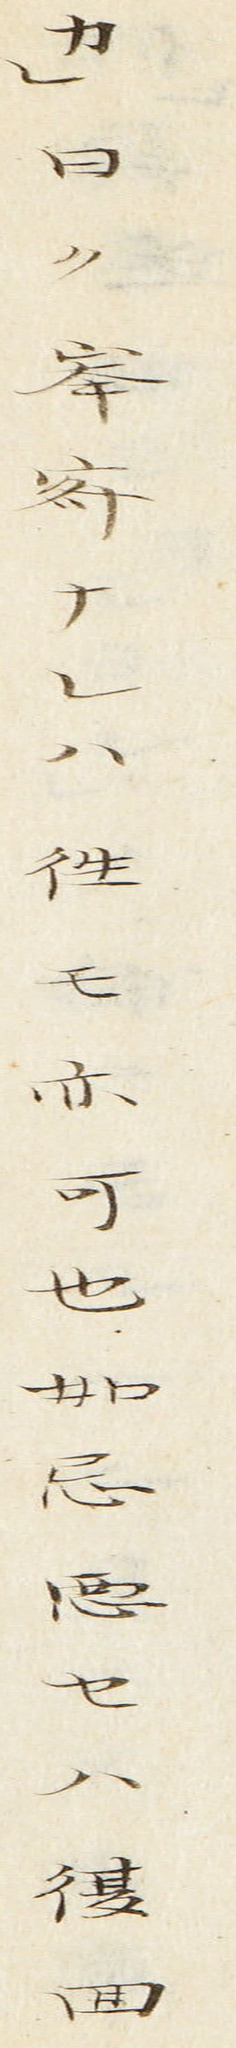カ」曰ク岑寂ナレハ往モ亦可也如忌悪セハ復回
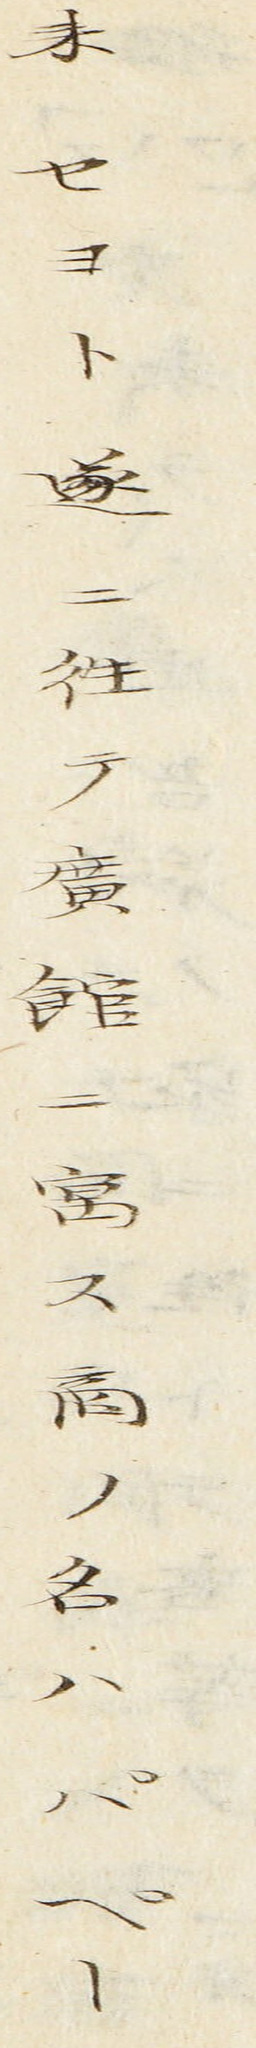来セヨト遂ニ往テ広館ニ寓ス商ノ名ハパペー
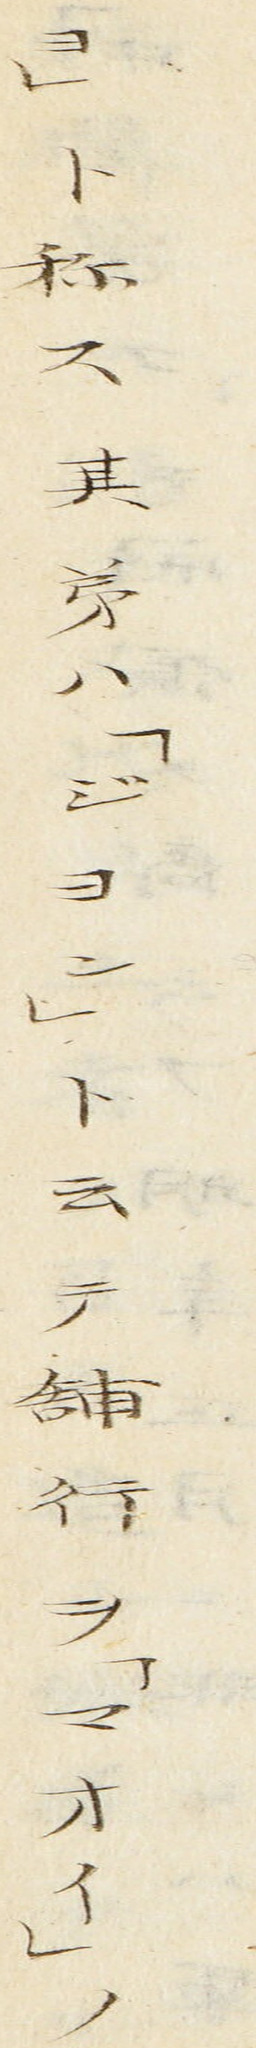ヨ」と称ス其弟ハ「ジヨン」ト云テ舗行ヲ「マオイ」ノ

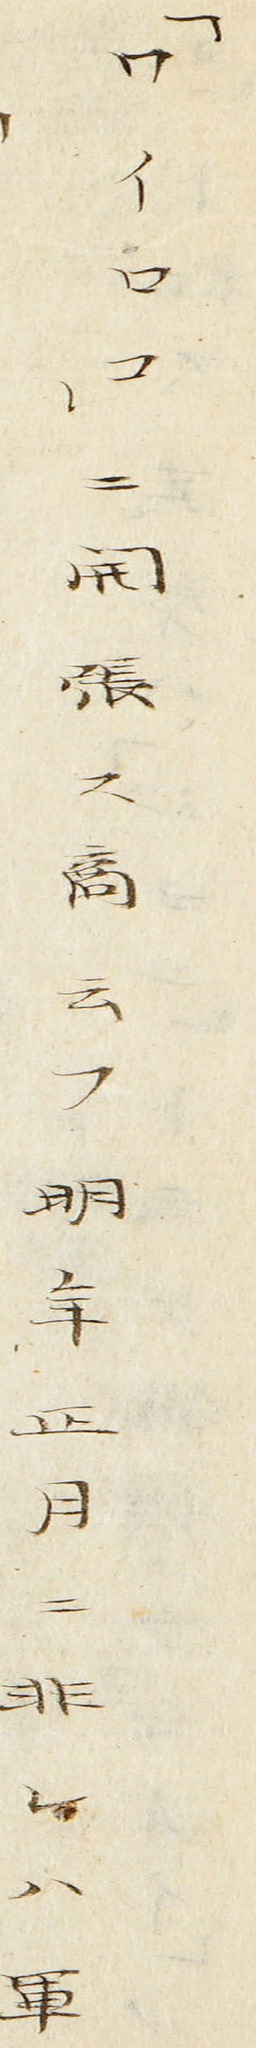「ワイロコ」ニ開張ス商云フ明年正月ニ非レハ軍
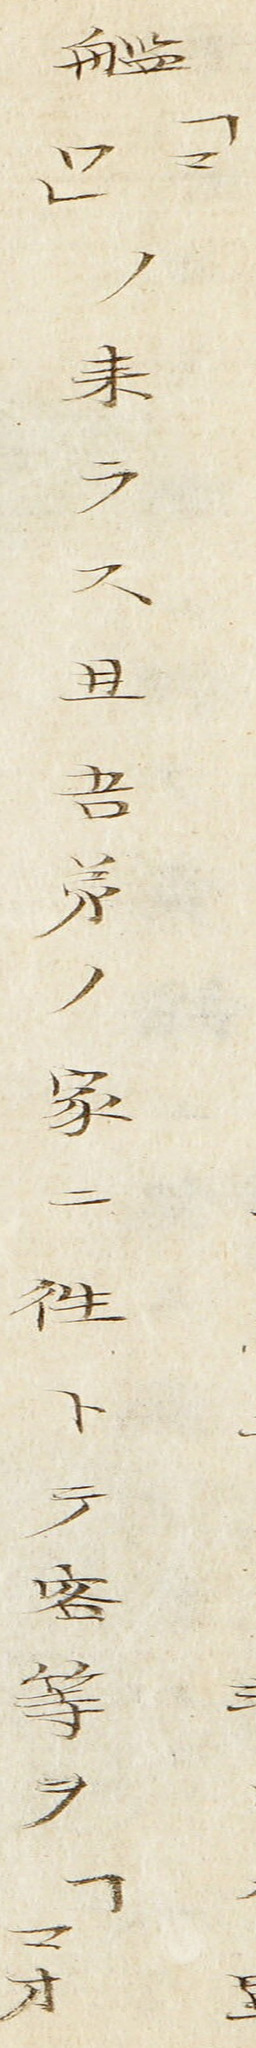艦「マワ」ノ来ラス且吾弟ノ家ニ往トテ客等ヲ「マオ
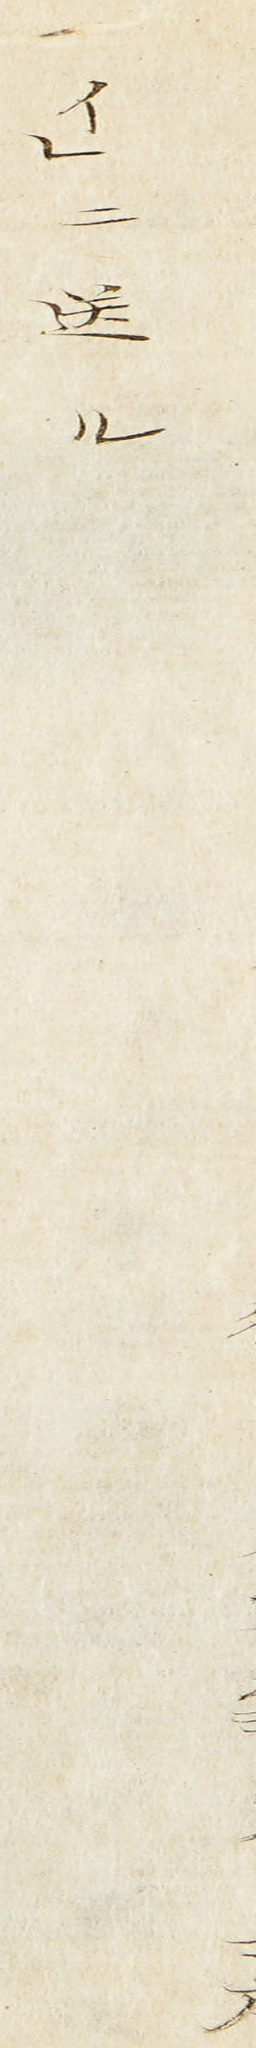イ」ニ送ル
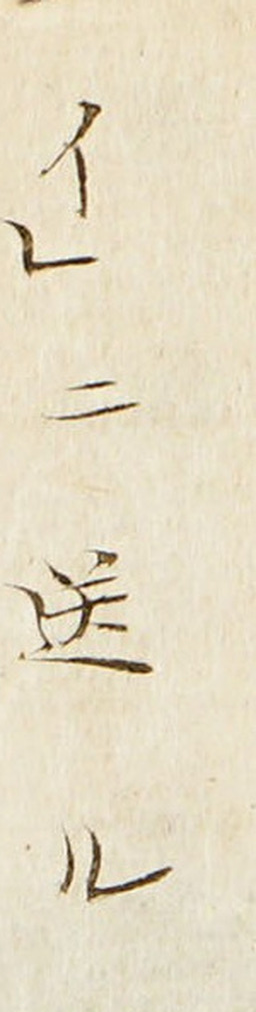イ」ニ送ル
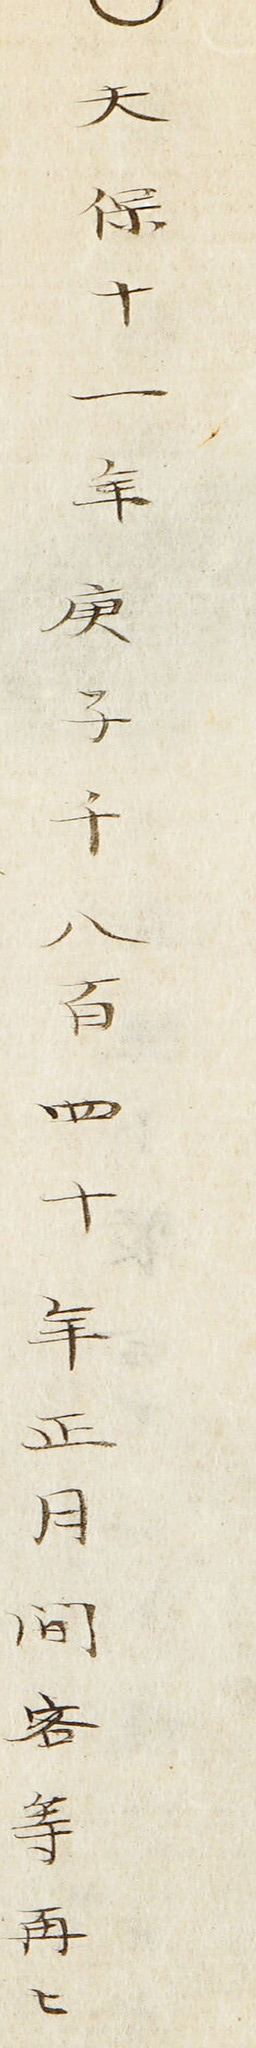○天保十一年庚子千八百四十年正月間客等再ヒ
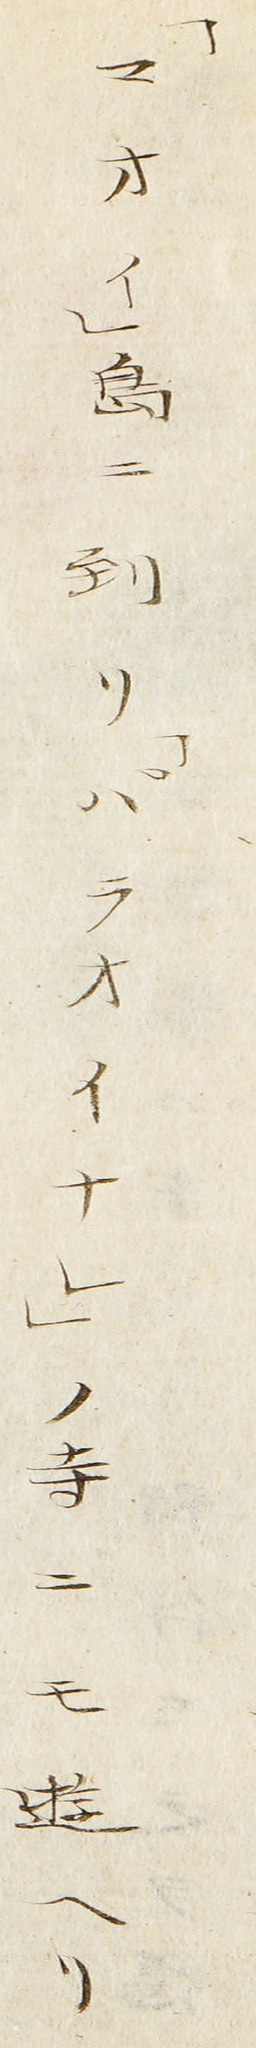「マオイ」島ニ到リ「パラオイナレ」ノ寺ニモ遊ヘリ
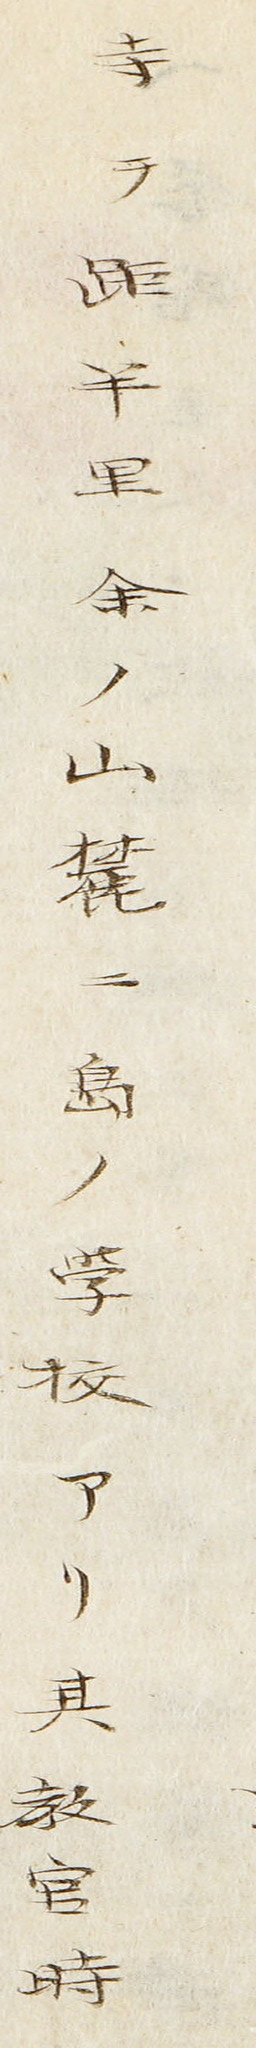寺ヲ距半里余ノ山麓ニ島ノ学校アリ其教官時
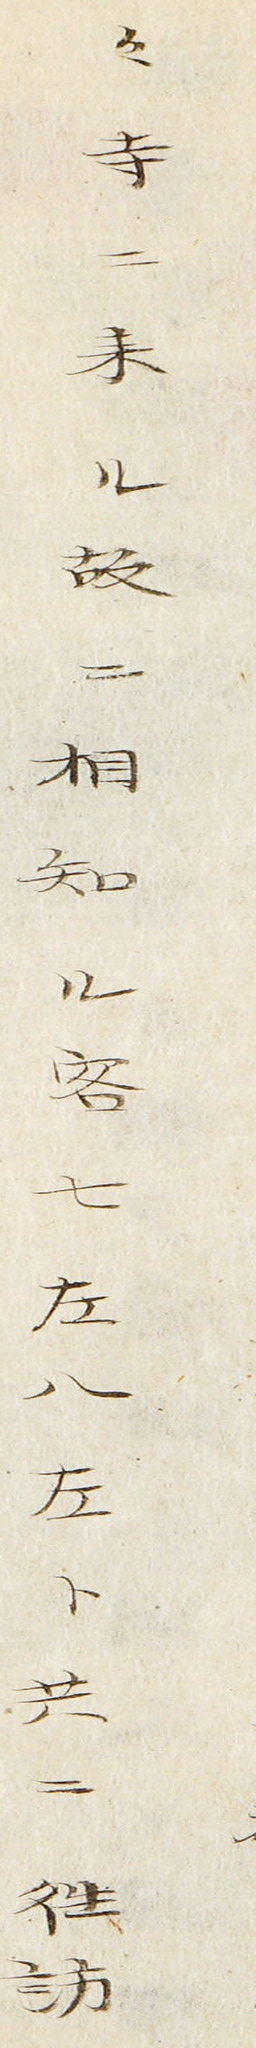々寺ニ来ル故ニ相知ル客七左八左ト共ニ往訪
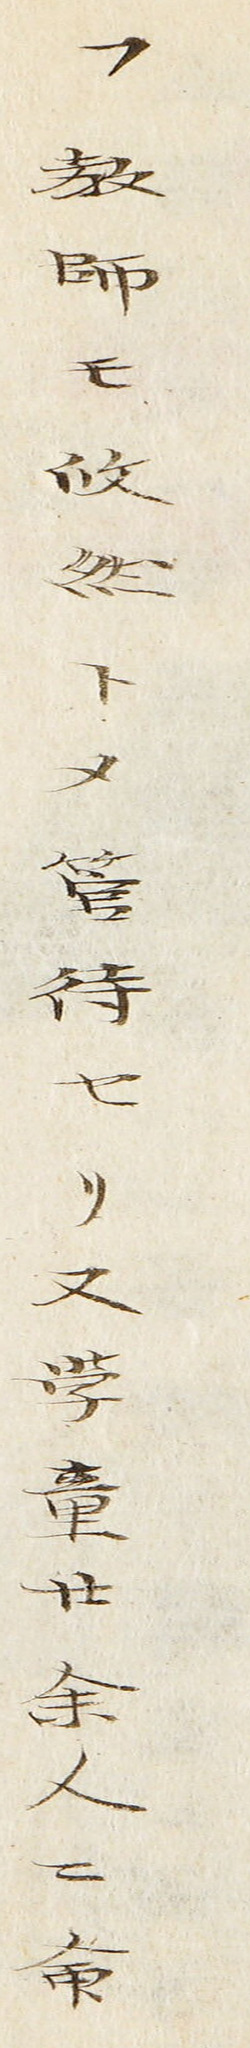フ教師モ欣然トシテ管待セリ又学童廿余人ニ命
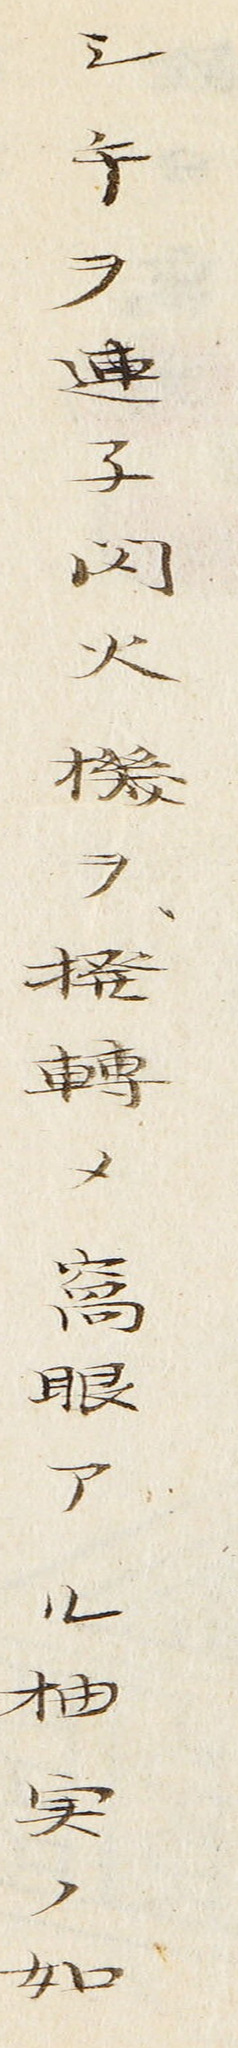シ手ヲ連ネ閃火機ヲ撥転シテ窩眼アル柚実ノ如
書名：流蕃通書
